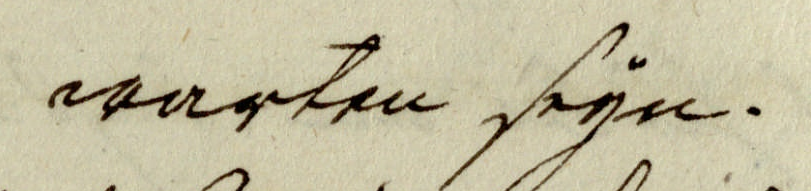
warten seÿn.
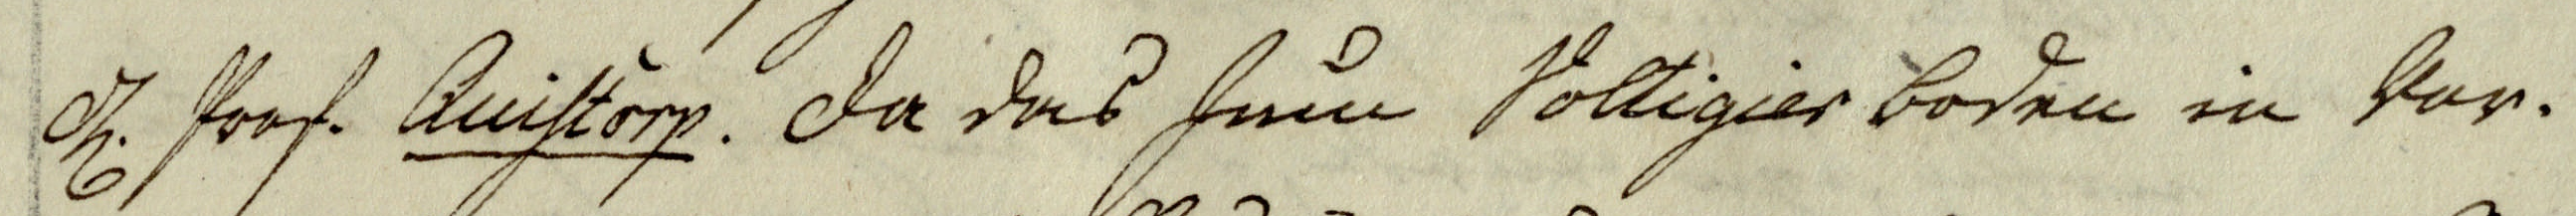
dh. Prof. Quistorp. Da das zum Voltigier Boden in Vor¬
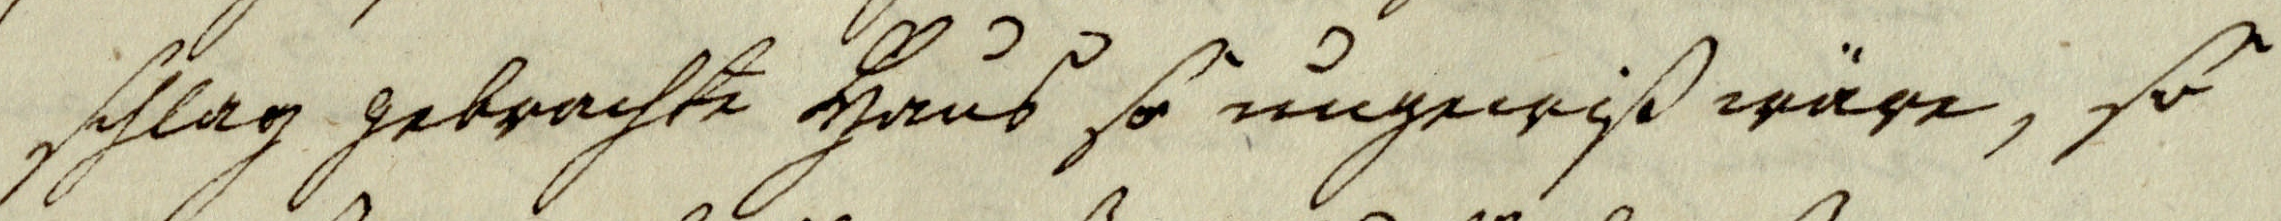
schlag gebrachte Haus so ungewiß wäre, so
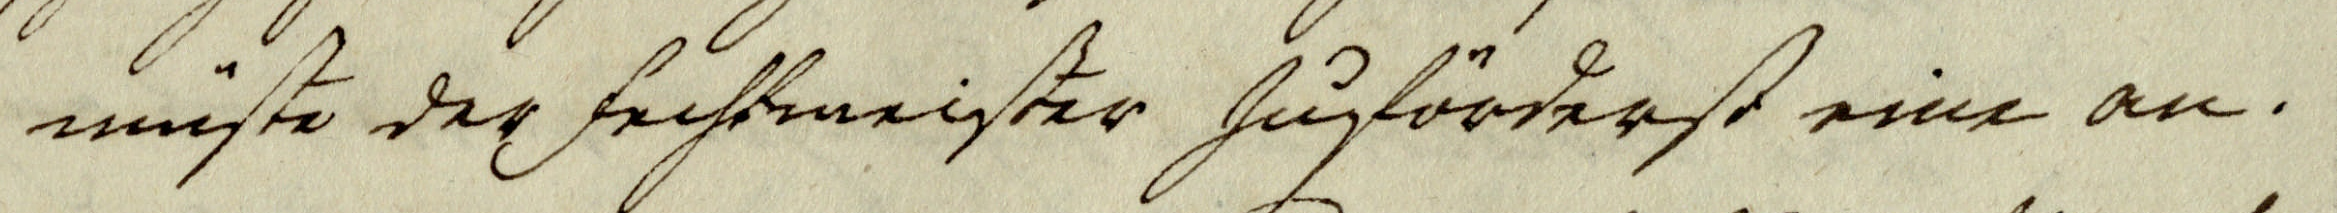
müsste der Fechtmeister zuvörderst eine an¬
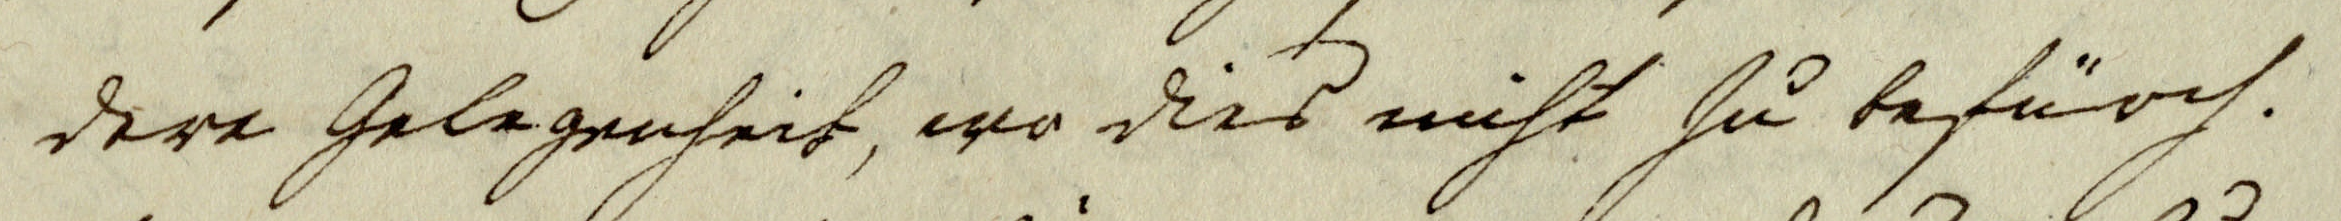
dere Gelegenheit, wo dies nicht zu befürch¬
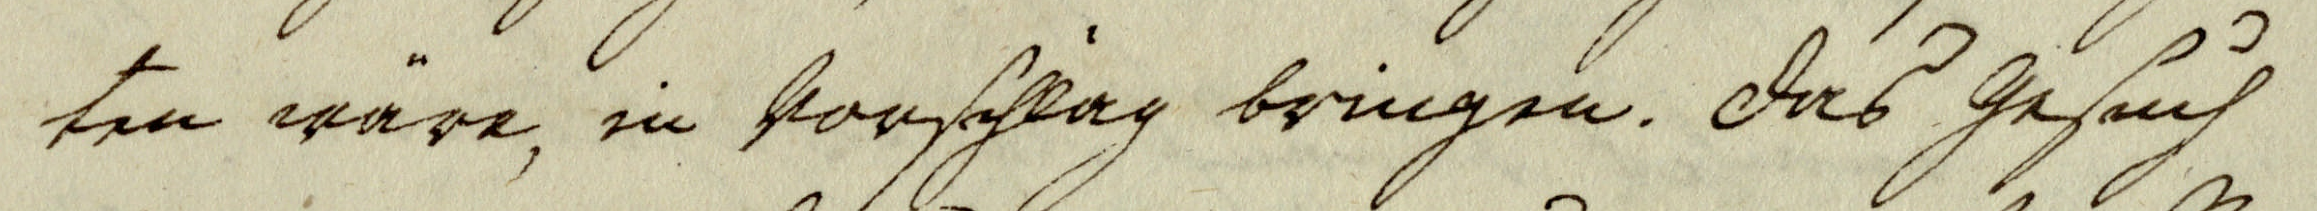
ten wäre, in Vorschlag bringen. Das Gesuch
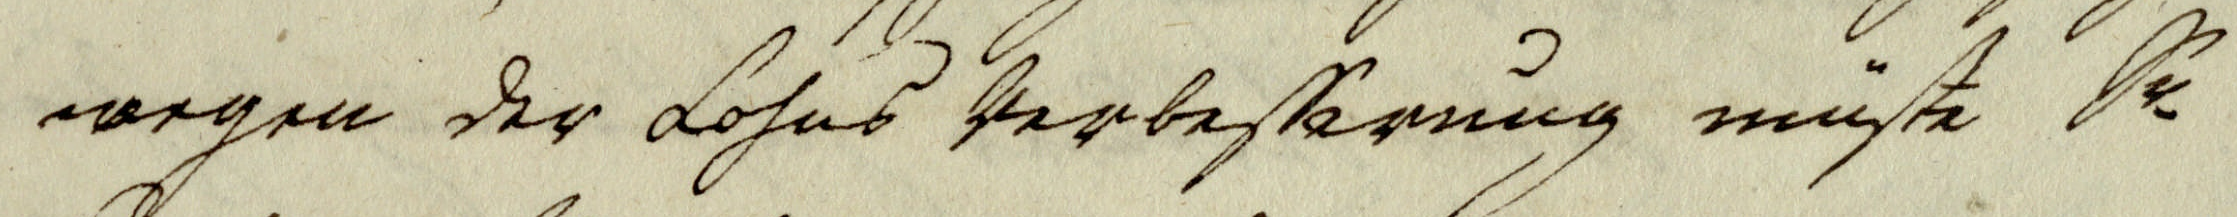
wegen der Lohns Verbesserung müsste Sr.
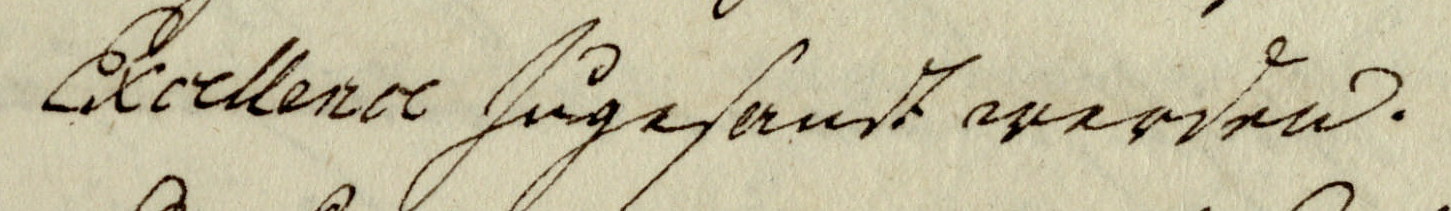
Excellence zugesandt werden.
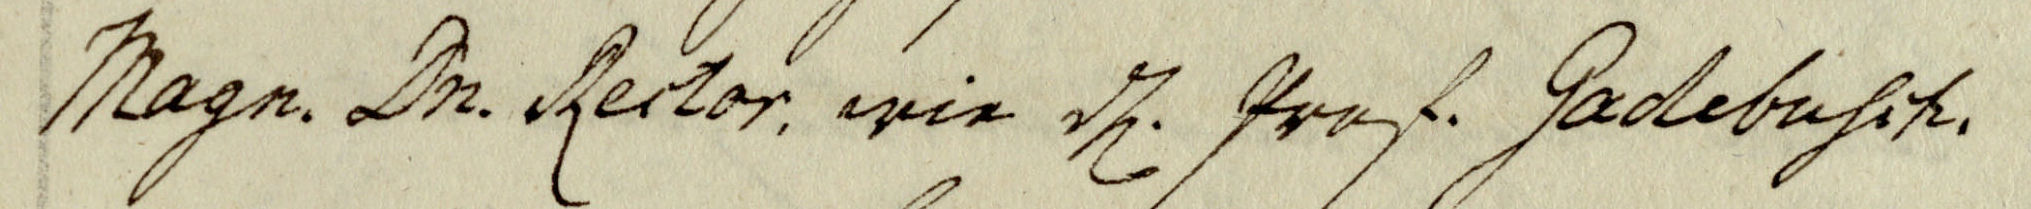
Magn. Dn. Rector wie dh. Prof. Gadebusch.
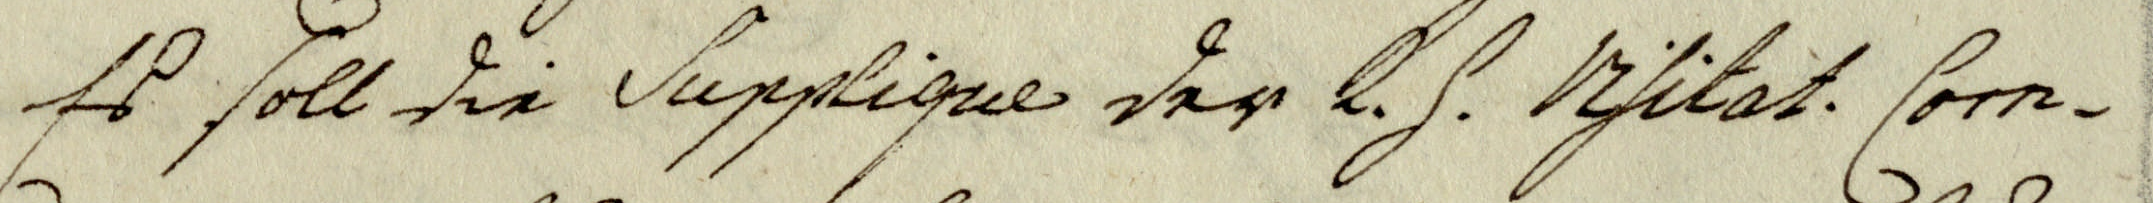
Es soll die Supplique der K. H. Visitat. Com¬
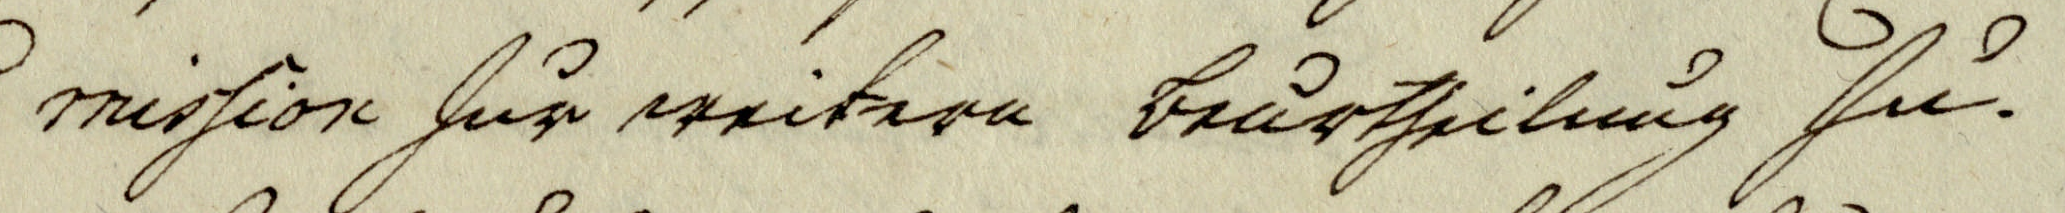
mission zur weitern Beurtheilung zu¬
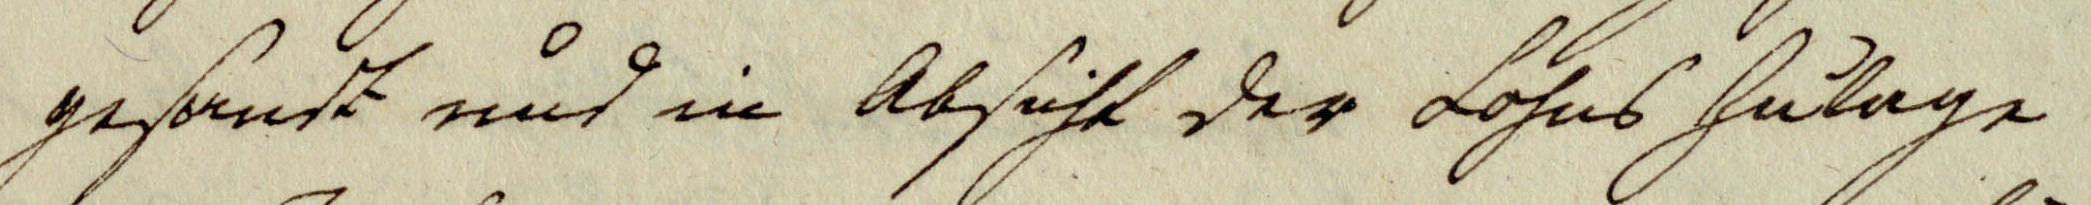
gesandt und in Absicht der Lohns Zulage
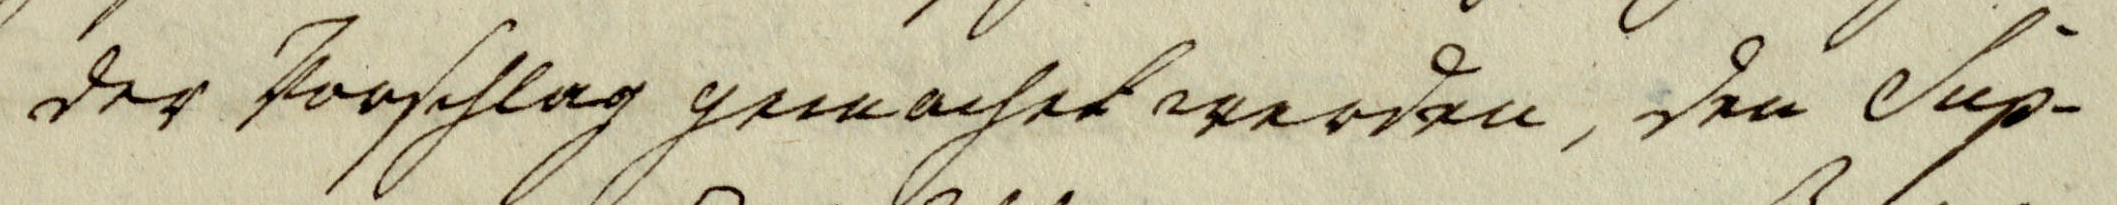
der Vorschlag gemacht werden, den Sup¬
